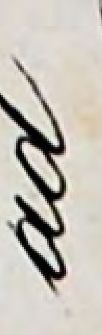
ad
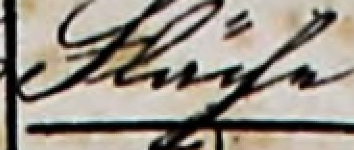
Fläche
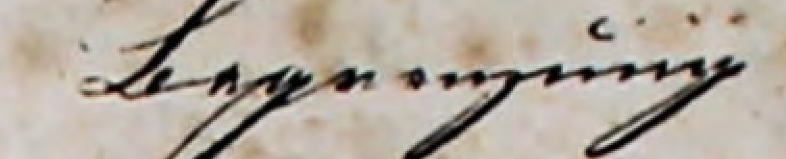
Begrenzung
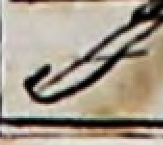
J.
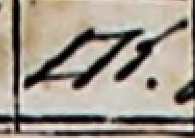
CK.
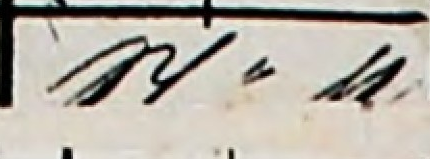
M = ??
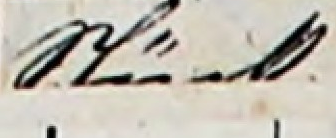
Neu??
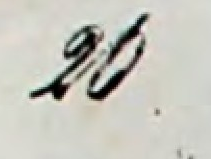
26
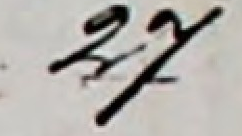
27
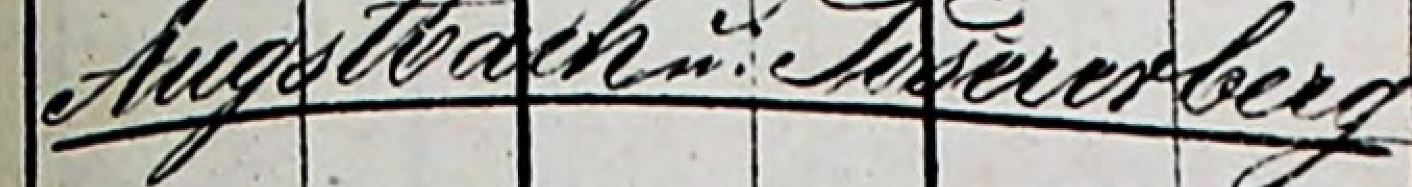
Augstbach u. Posererberg
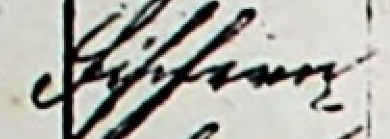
Fischern„
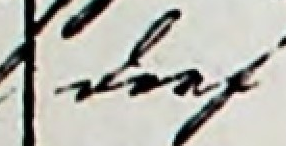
dorf
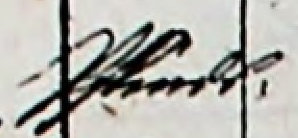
Pflinds„
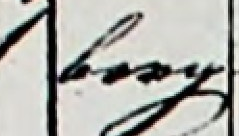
berg
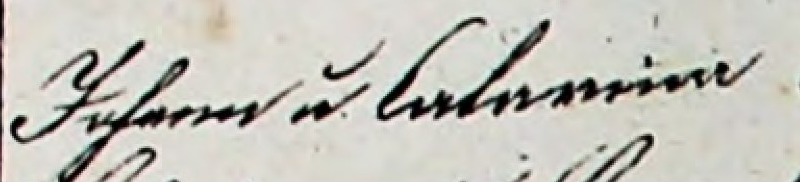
Johann u Calarina
